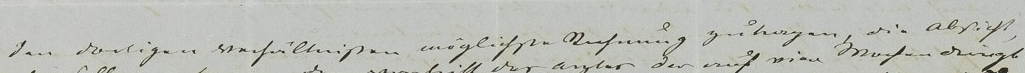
den dortigen Verhältnißen möglichste Rechnung zu tragen, die Absicht,
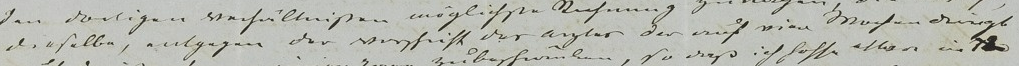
dieselbe, entgegen der Vorschrift des Arztes der auf vier Wochen dringt
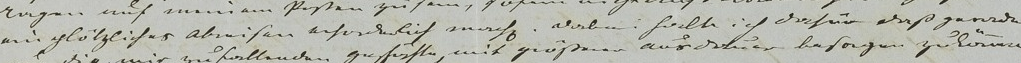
ein plötzliches Abreisen erforderlich machen. Dabei halte ich dafür, daß gerade
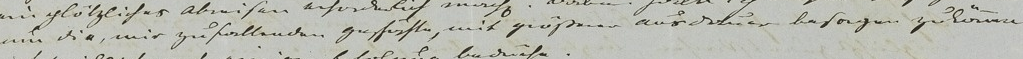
um die, mir zufallenden Geschäfte, mit größerer ausdauer besorgen zu können
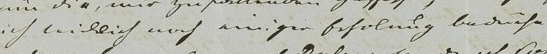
ich wirklich noch einiger Erholung bedürfe.
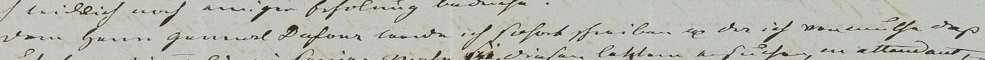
Dem Herrn General Dufour werde ich sofort schreiben & da ich vermuthe daß
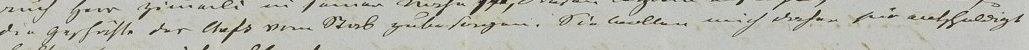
die Geschäfte des Chefs vom Stab zubesorgen. Sie wollen mich daher für entschuldigt
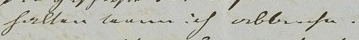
halten wenn ich abbreche.
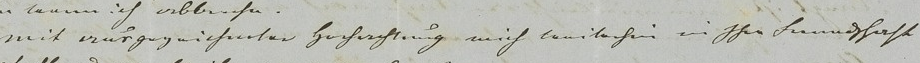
Mit ausgezeichneter Hochachtung mich weiterhin in Ihre Freundschaft
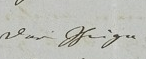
Der Ihrige
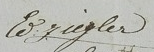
Ed: Ziegler
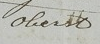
Oberst
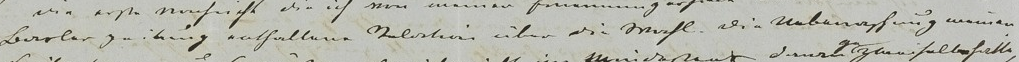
Baslerzeitung entfallene Relation über die Wahl. Die Ueberaschung meiner
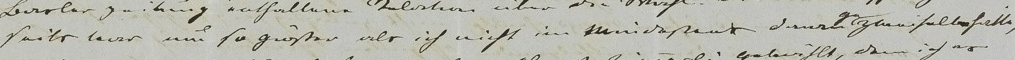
seits war um so größer als ich nicht im Mindesten daran gezweifelt hatte,
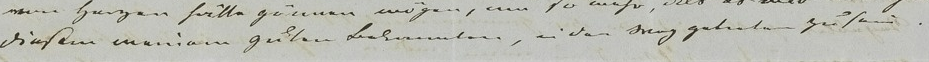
diesem meinem guten Bekannten, in den Weg getreten zu sein. -
